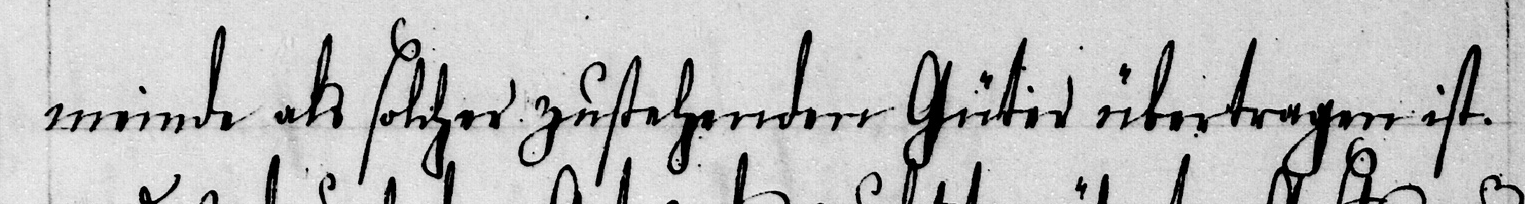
meinde als solcher zustehenden Güter übertragen ist.
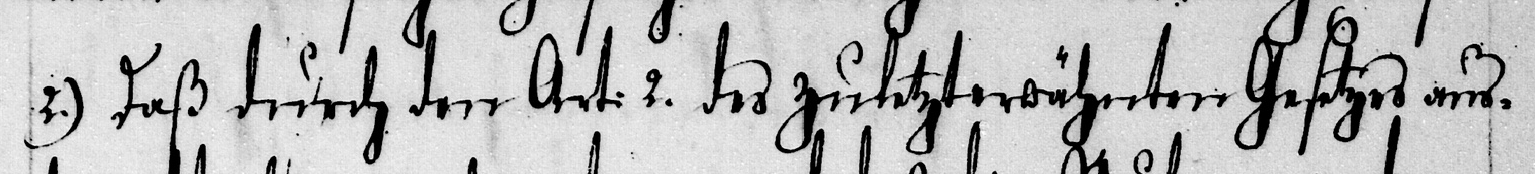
2.) Daß durch den Art: 2. des zuletzterwähnten Gesetzes aus¬
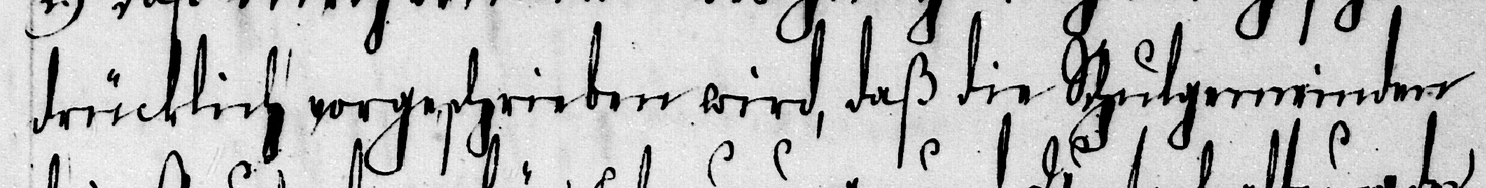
drücklich vorgeschrieben wird, daß die Schulgemeinden
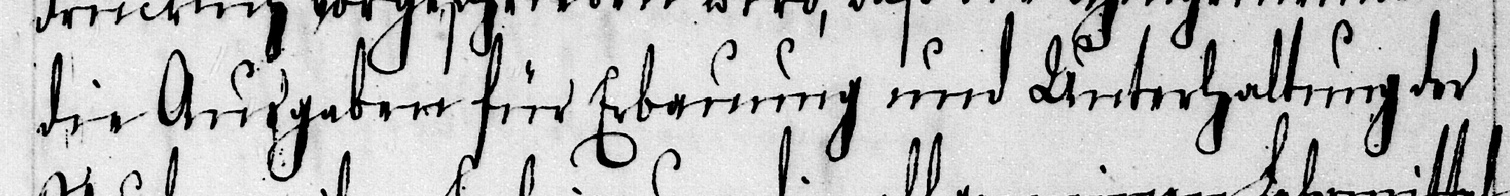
die Ausgaben für Erbauung und Unterhaltung der
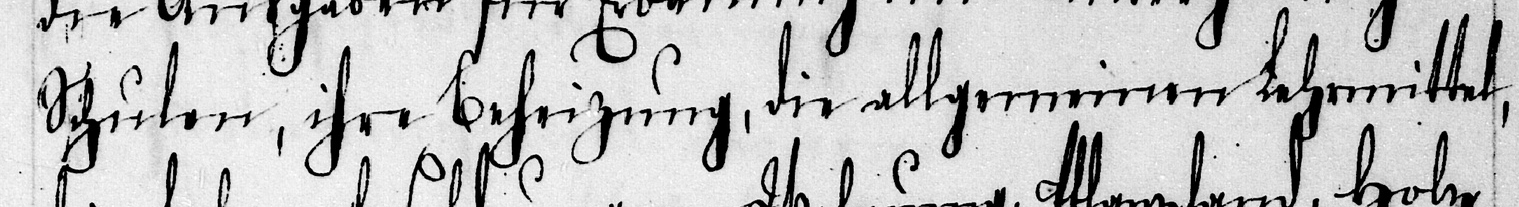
Schulen, ihre Beheizung, die allgemeinen Lehrmitte¬
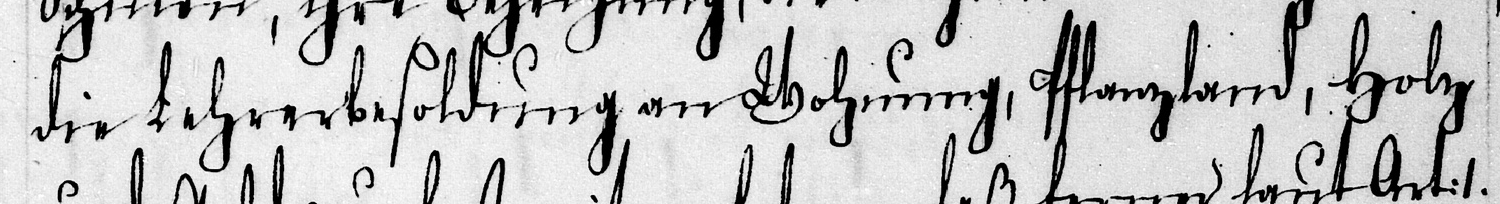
die Lehrerbesoldung an Wohnung, Pflanzland, Holz
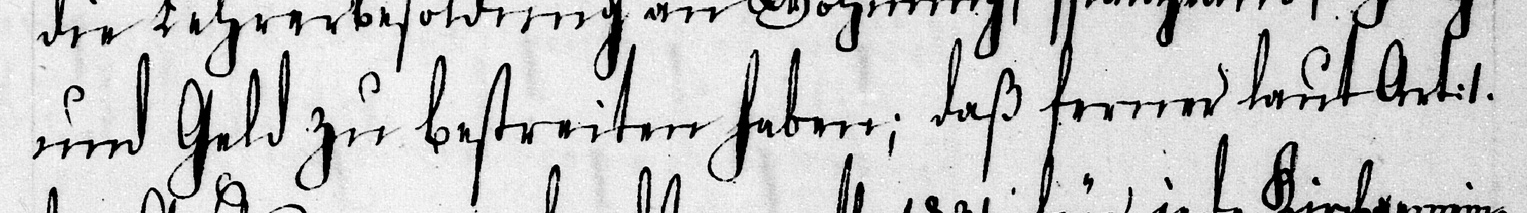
und Geld zu bestreiten haben; daß ferner laut Art:
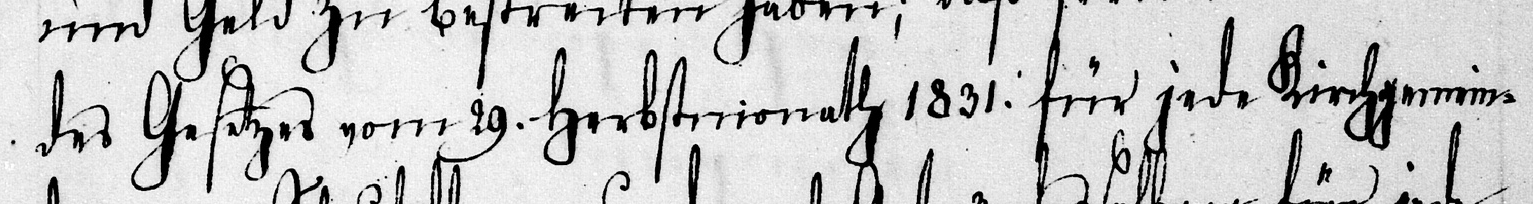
des Gesetzes vom 29. Herbstmonath 1831. für jede Kirchgemein¬
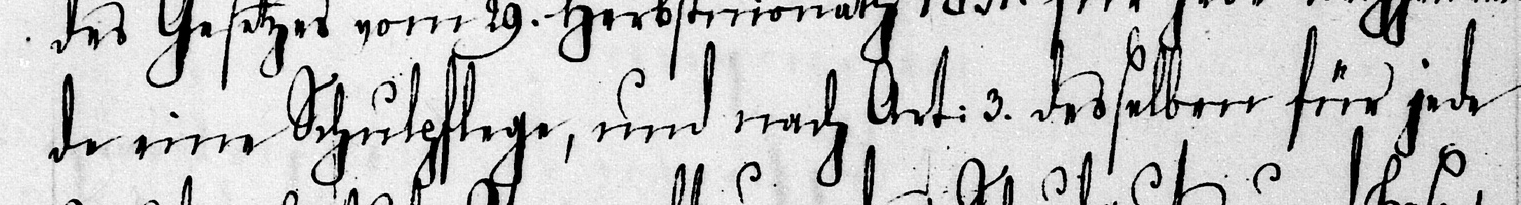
de eine Schulpflege, und nach Art: 3. desselben für jede
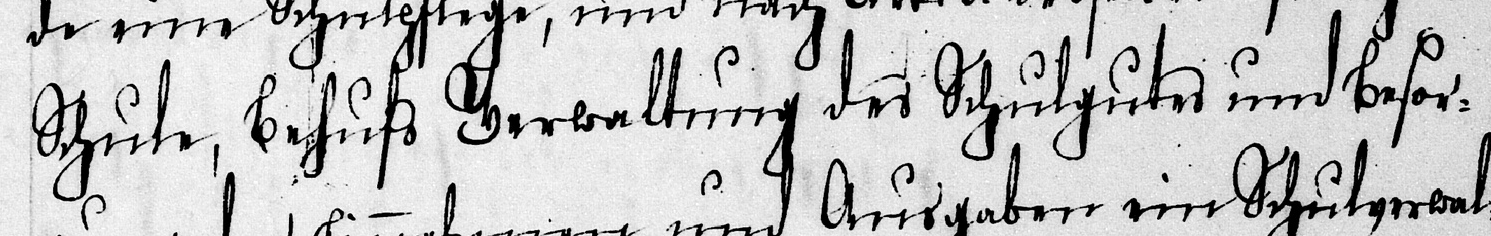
Schule, Behufs Verwaltung des Schulgutes und Besor¬
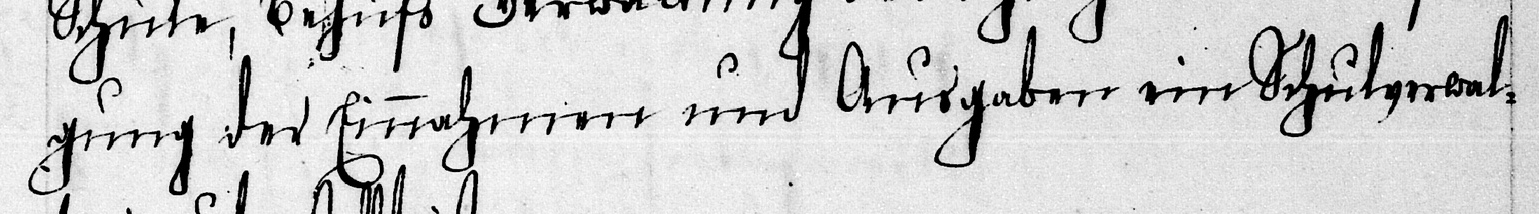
gung der Einnahmen und Ausgaben ein Schulverwal¬
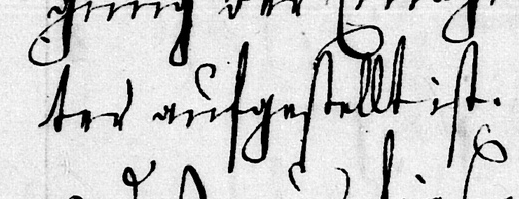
ter aufgestellt
